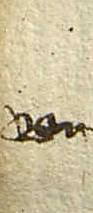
%%%
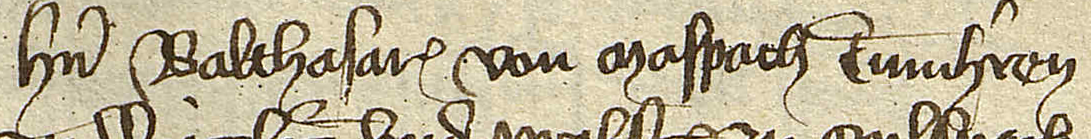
hn* Balthaſar* von Maſpach Tumh*ren
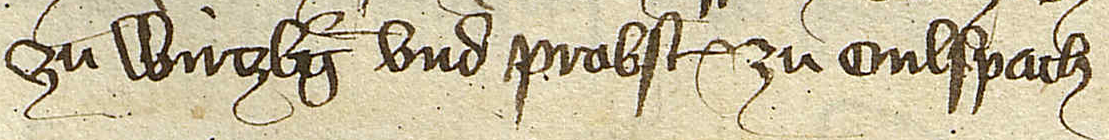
cʒu Wircʒb*g vnd probſt* cʒu Onlſpach
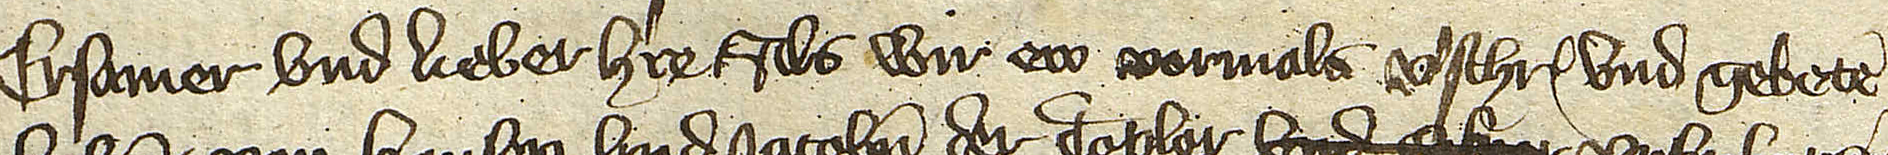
Erſamr vnd lieber h*re / Als wir ew vormals v*ſchr* vnd gebete*
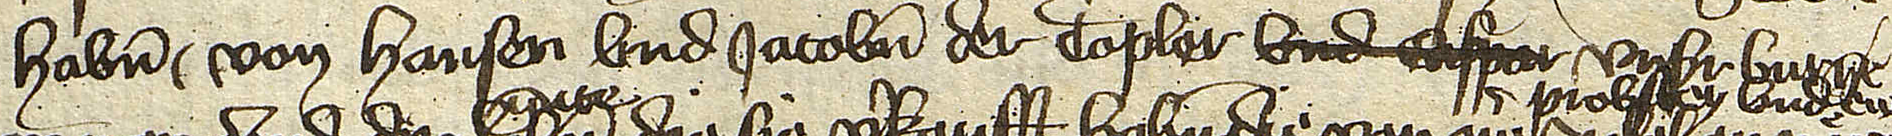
habn* / von hanſen vnd Iacobn* Topler vnd Caſpar vnſ*r burge*
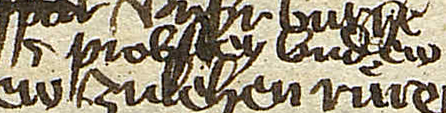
probſten vnd ew
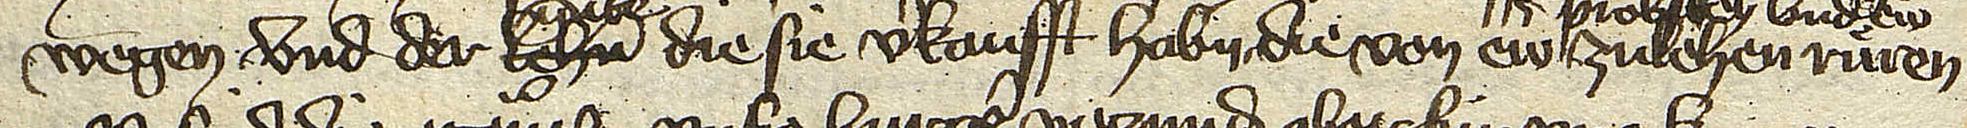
wegen / vnd der lehn* die ſie v*kaufft habn* / die von ew* cʒulehen rüren
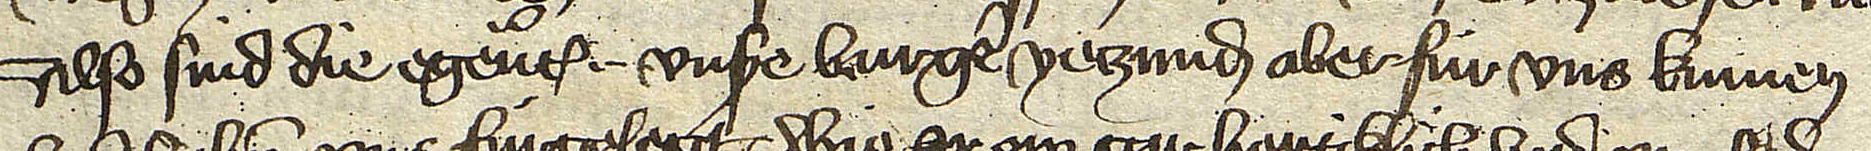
Alſo ſind die egen*t* ~ vnſ*e burge* yecʒund* aber für vns kumen
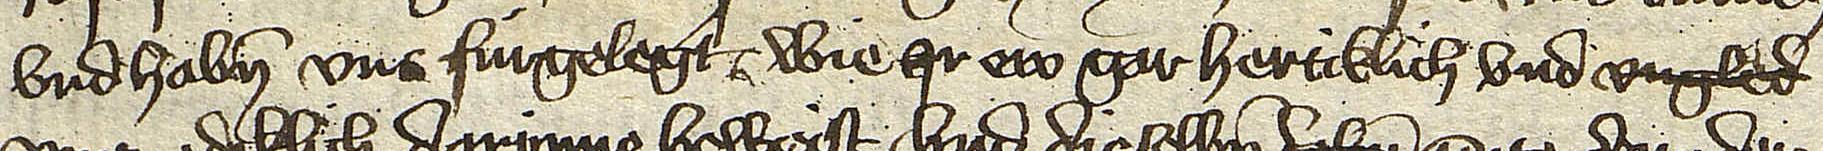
vnd habn* vns fürgelegt / wie Ir ew gar hertiklich vnd vngled
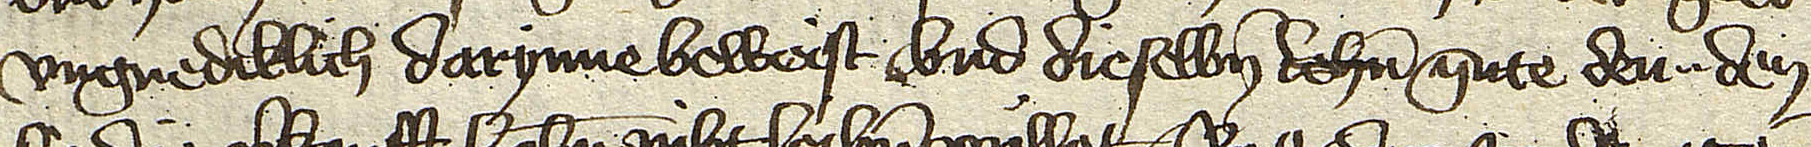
vngnediklich darynne beweiſt / vnd dieſelbn* lehn* gute den ~ den
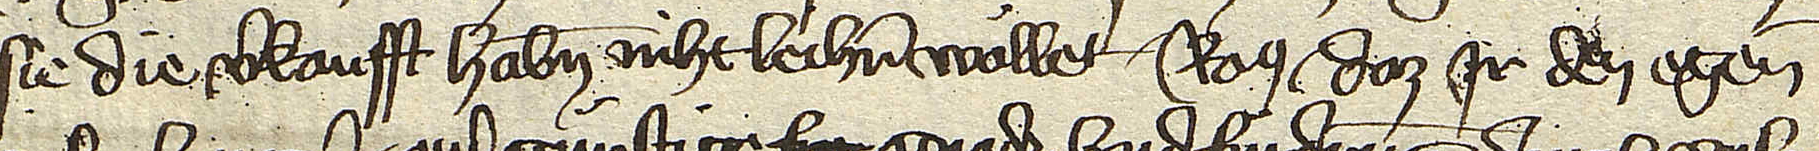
ſie die v*kaufft habn* niht leihn* wöllet / Ro* / daʒ Ir den egen*
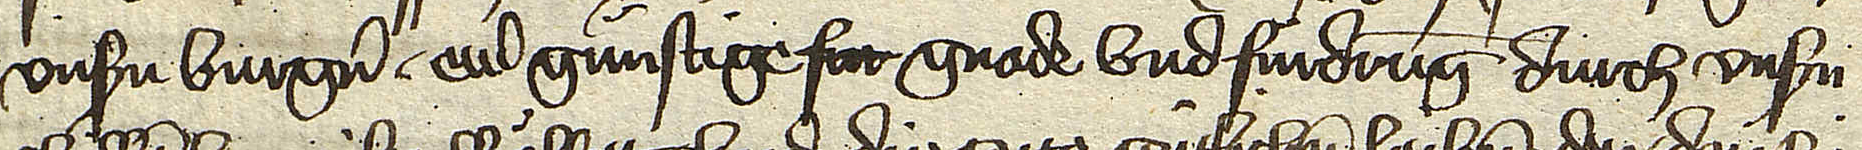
vnſ*n burgn* / ew* günſtige fur gnade vnd fürdrug* durch vnſ*n
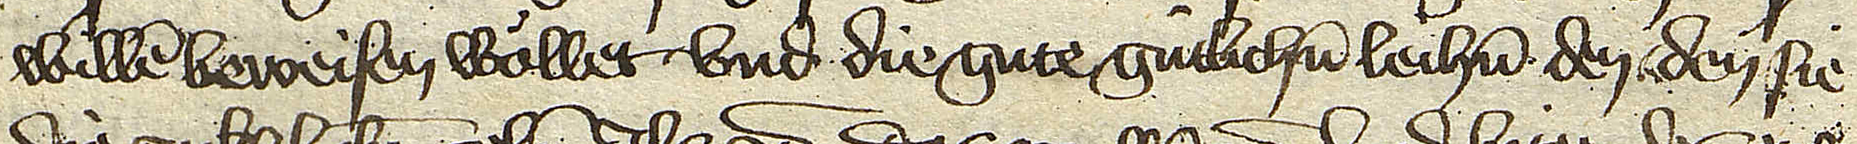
wille* beweiſen wöllet / vnd die gute gütlichn* leihn* den / den ſie
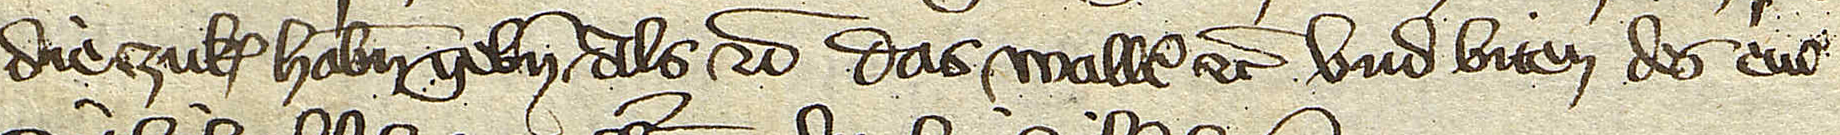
die cʒuk* habn* gebn* / Als ec* das wolle* ec* vnd biten des ew*
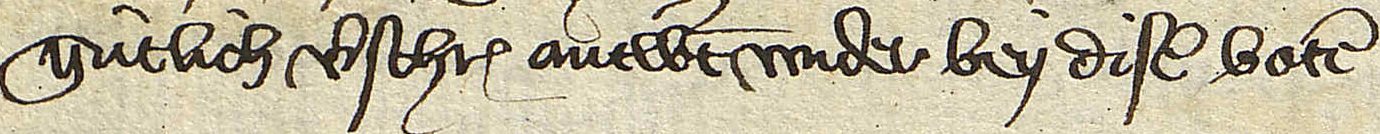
gütlich v*ſchr* antw*t wider bey diſe* bote*
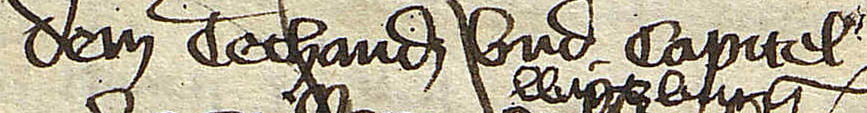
Dem Techand* vnd Capitel
